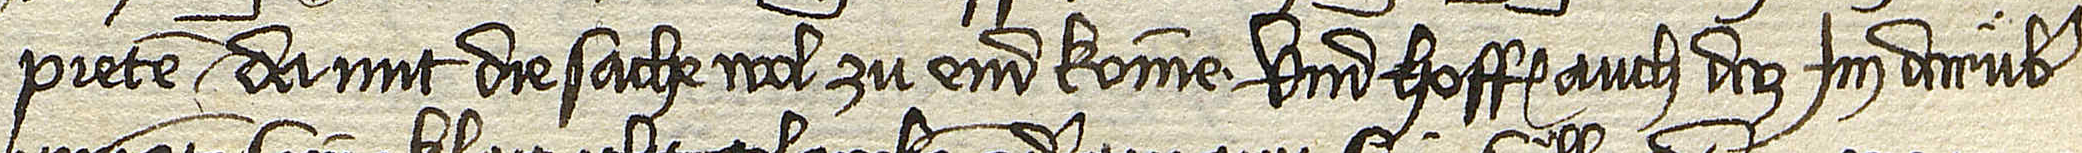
piete* / Da mit die ſache wol ʒu end kom*e . Vnd hoff* auch daʒ Im darüb*
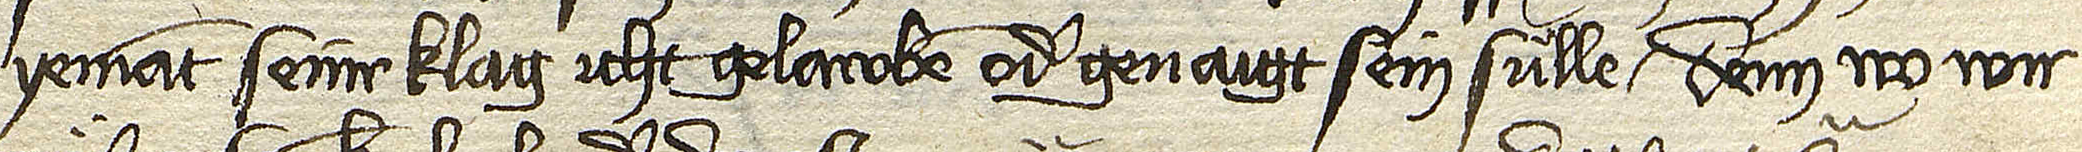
yema*t ſeinr klag icht gelawbe* od* genaigt ſein ſülle / Denn wo wir
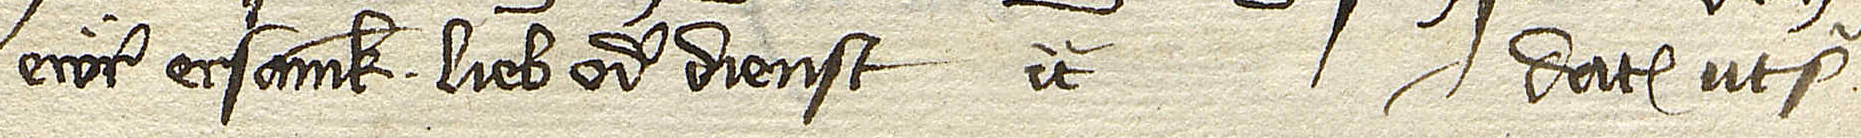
eẅr* erſamk* . lieb od* dienſt ec* / dat* ut ſ*
